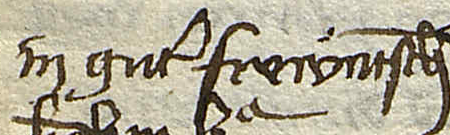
in gut* frewntſch*
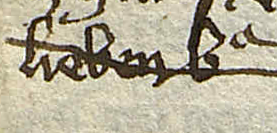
lieben b*
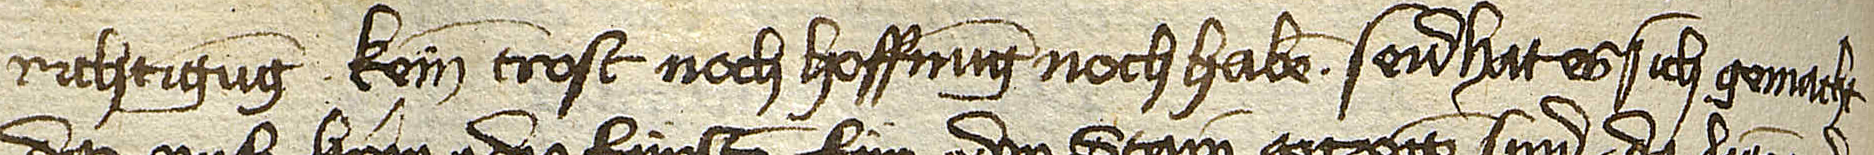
richtigu*g kein* troſt noch hoffnu*g noch habe* . ſeid hat es ſich gemacht
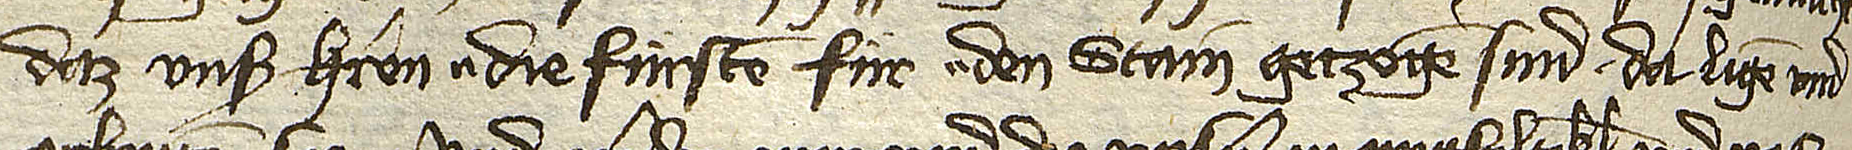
daʒ vnſ* h*ren ~ die fürſte* für ~ den Stain gecʒoge* ſind . da lige* vnd
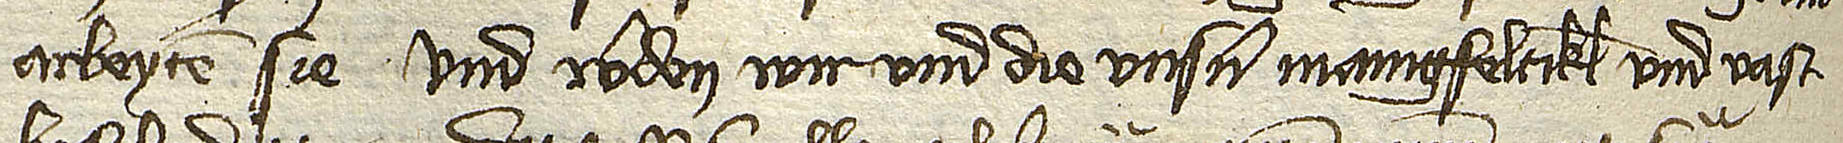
arbeyte* ſie . vnd w*den wir vnd die vnſ*n manigfeltikl* vnd vaſt
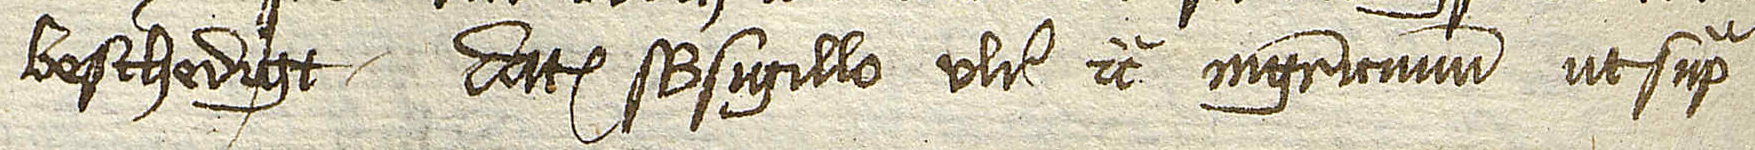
beſchedigt / Dat* ſ*B ſigillo vlr* ec* m*g*riciuiu* ut ſup*
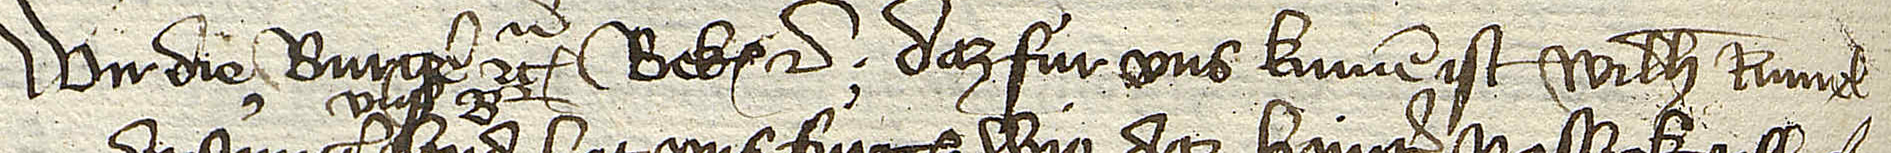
Wir die Burge* ec* Bek* ec* . daʒ für vns kume* iſt wilh* Rumel
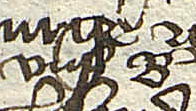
vnſ* B*
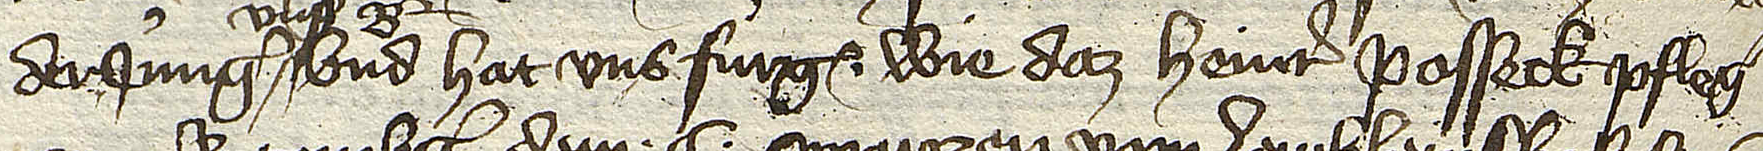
der Iüng* vnd hat vns fürg* . wie daʒ heinr* Poſſeck pfleg*
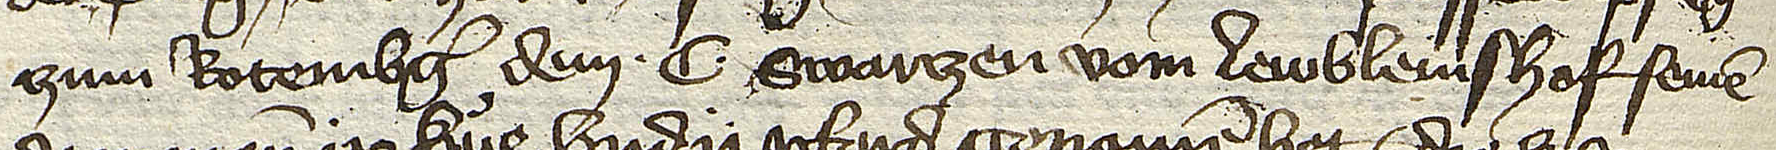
cʒum Rotembg* dem . C . Swarcʒen vom lewbleinſhof ſeine*
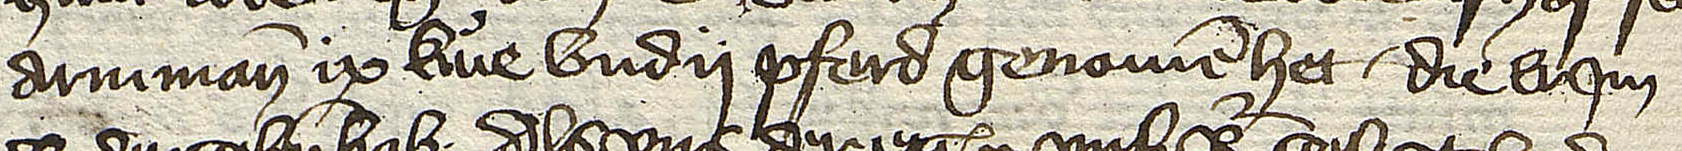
Armman* ix kwe vnd ii pferd genome* het / die Er Im
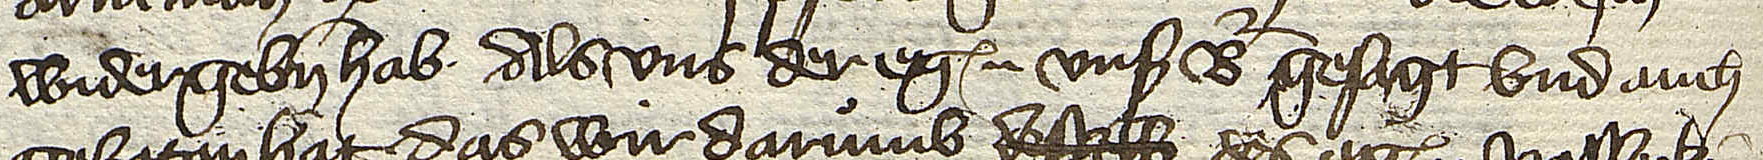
widergeb*n hab . Als vns der eg* ~ vnſ* B* geſagt vnd auch
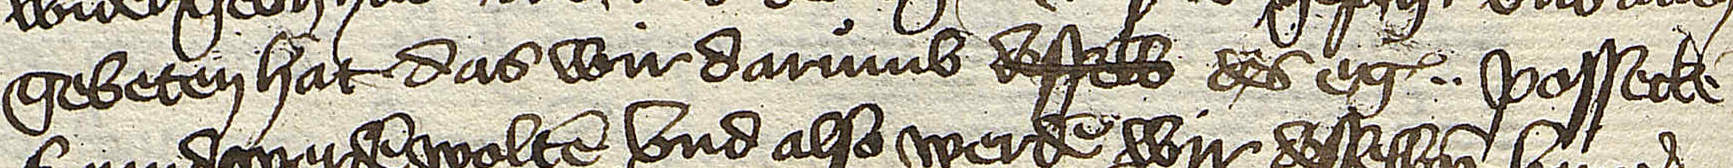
gebeten hat / das wir darümb deſſelb des eg* ~ Poſſecke*
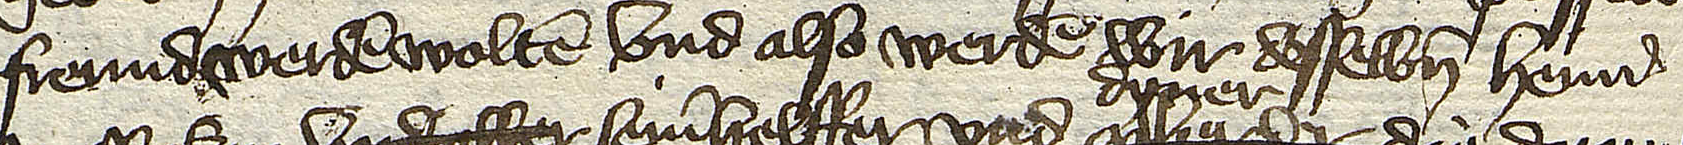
freund werd* wolte* vnd alſo werd* wir deſſelb*n heinr*
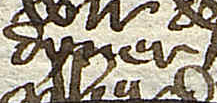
dyner
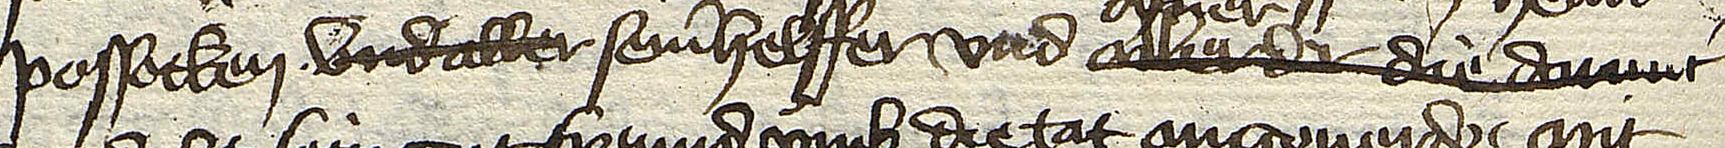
poſſecken . vnd aller ſein* helffer vnd aller der die darunt*
